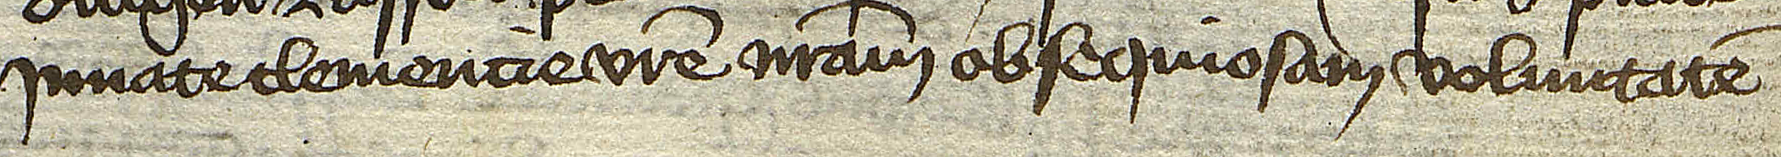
Innate clemencie v*re n*ram obſequioſam voluntate*
